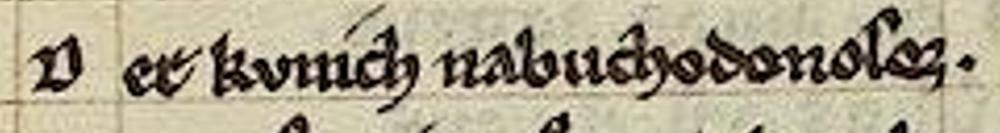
Der kvnich nabuchodonoſor.
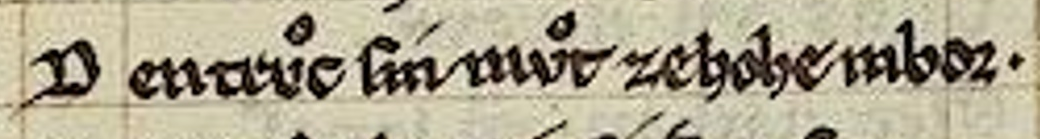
Dentrv°oc ſin mv°ot zehohe inbor.
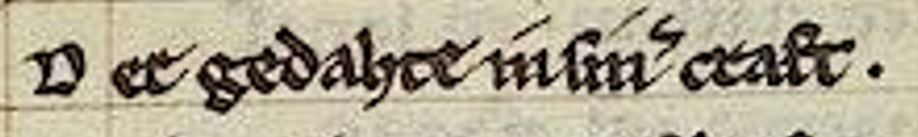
Der gedahte in ſin(er) craft.
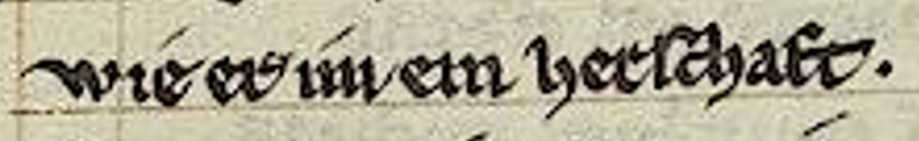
Wie er im ein herſchaft.
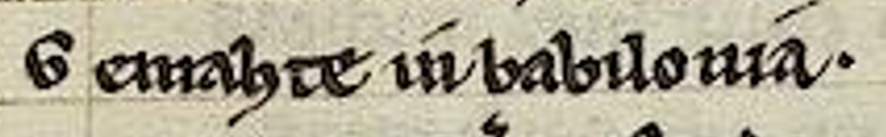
Gemahte in babilonia.
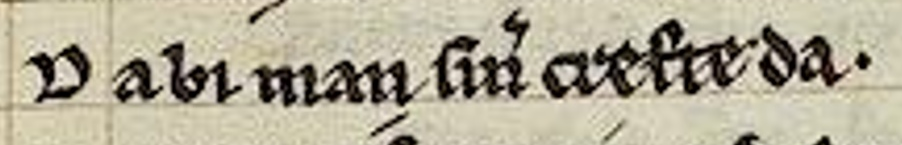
Dabi man ſin(er) crefte da.
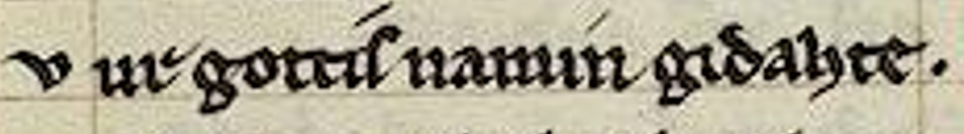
Vur gottiſ namin gidahte.
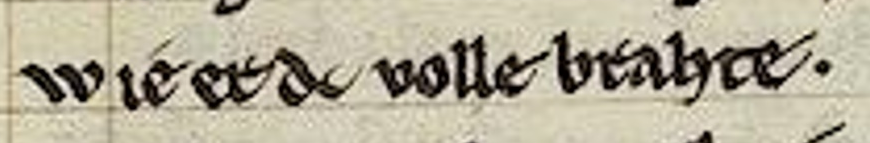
Wie er d(az) volle brahte.
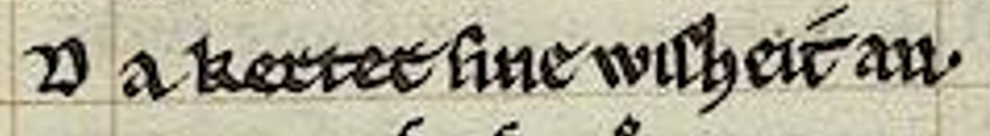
Da kerter ſine wiſheit an.
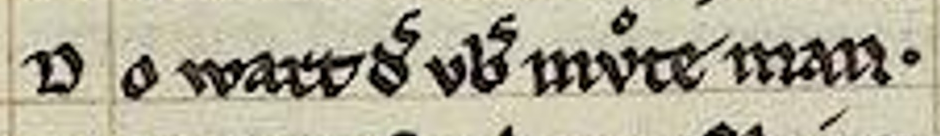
Do wart d(er) vb(er) mv°ote man.
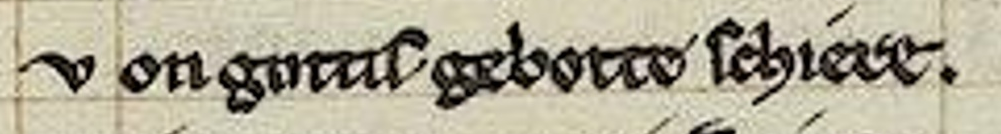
Von gottiſ gebotte ſchiere.
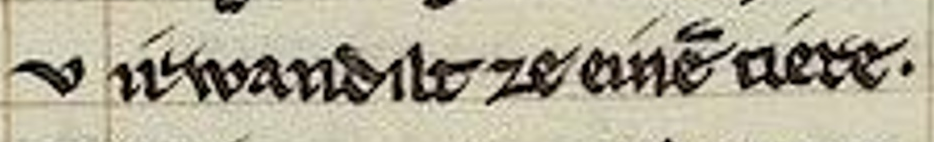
Virwandilt ze eine(m) tiere.
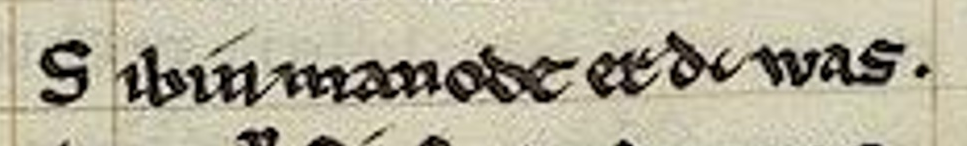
Sibin manode er d(az) was.
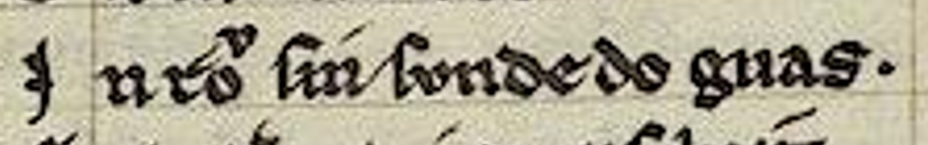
In ro°v ſin ſvnde do gnas.
